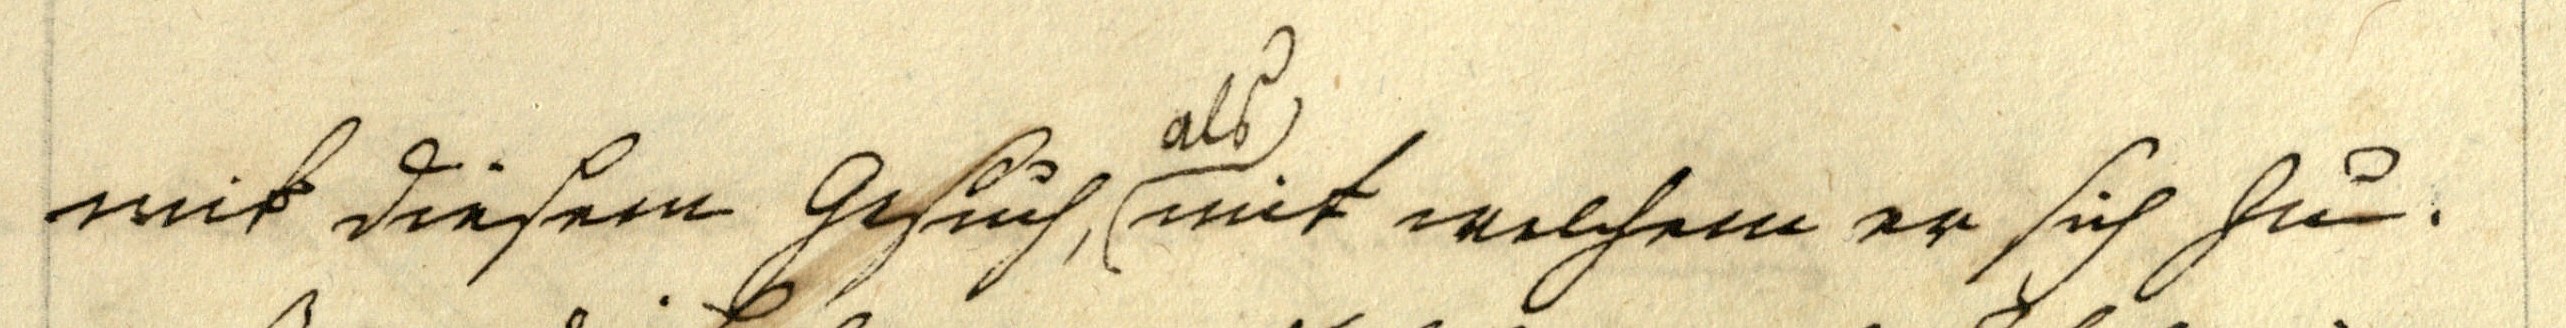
mit diesem Gesuch, als mit welchem er sich zu¬
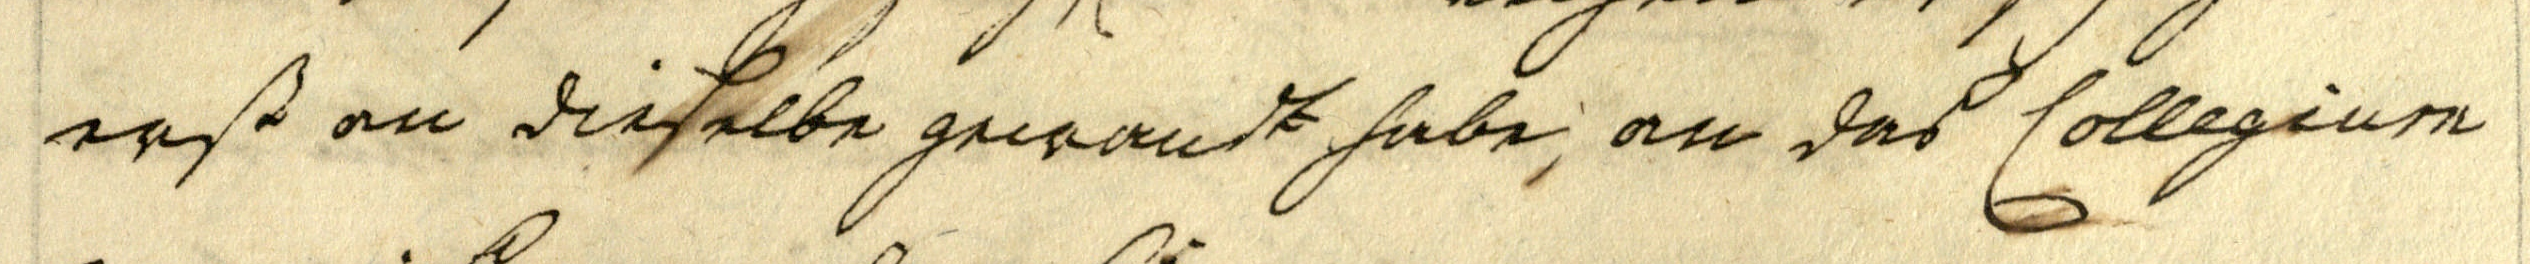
erst an dieselbe gewandt habe, an das Collegium
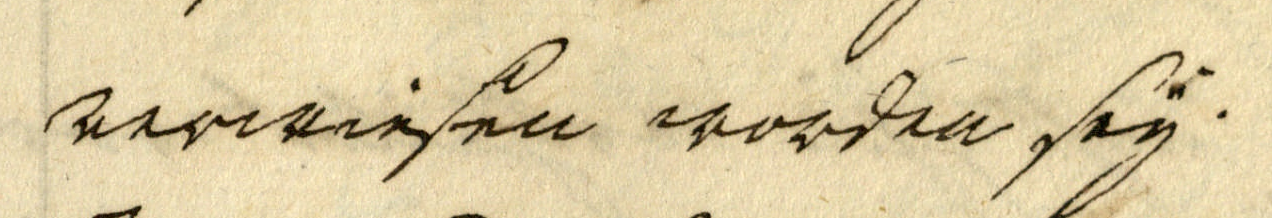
verwiesen worden seÿ.
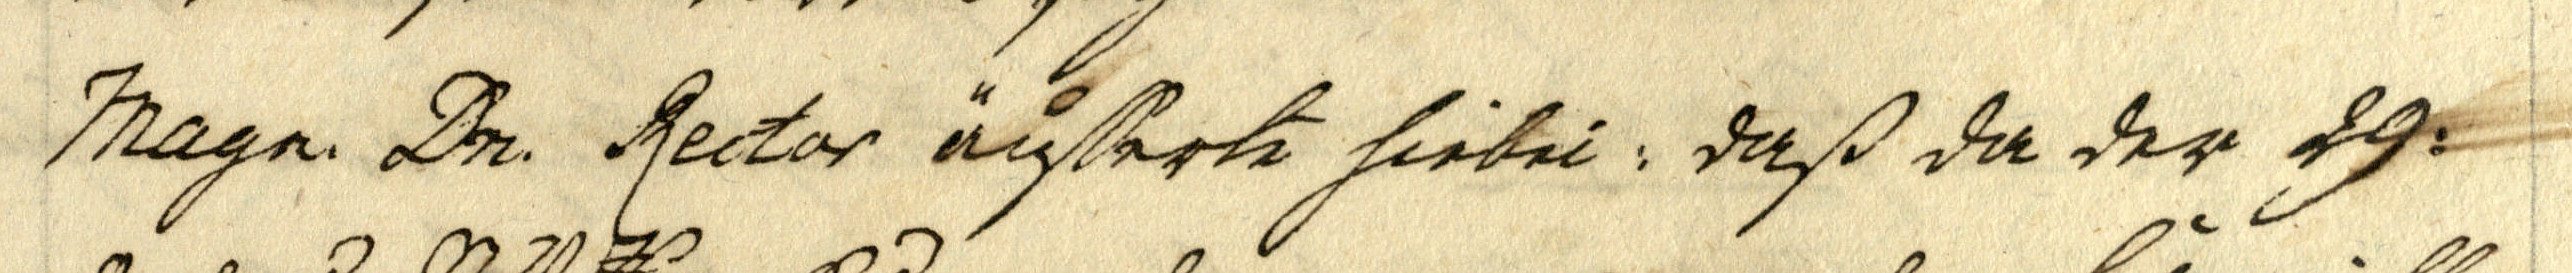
Magn. Dn. Rector äusserte hiebei,: daß da der 29.
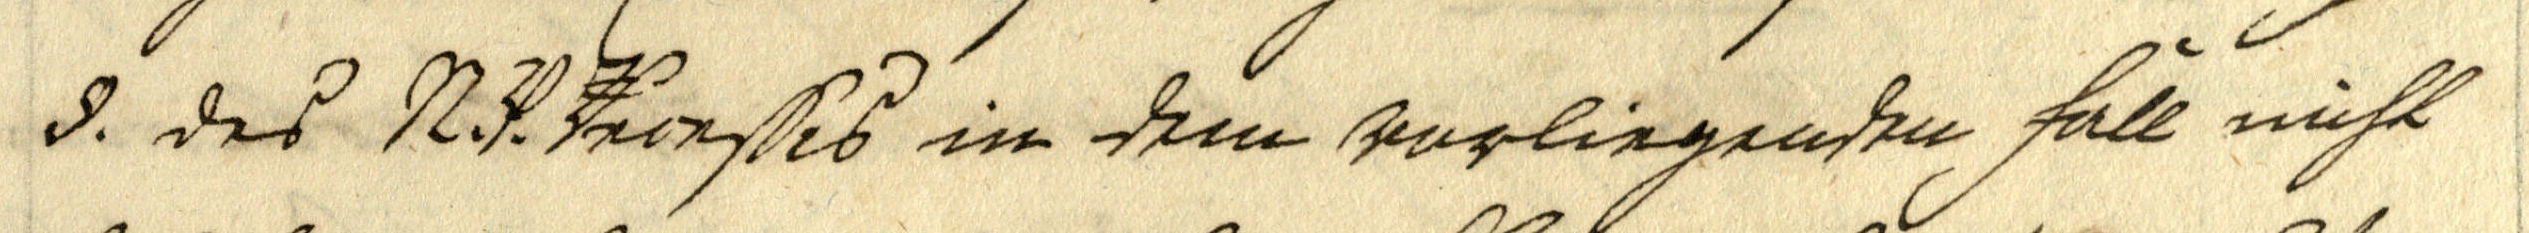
§. des N. V. Recesses in dem vorliegenden Fall nicht
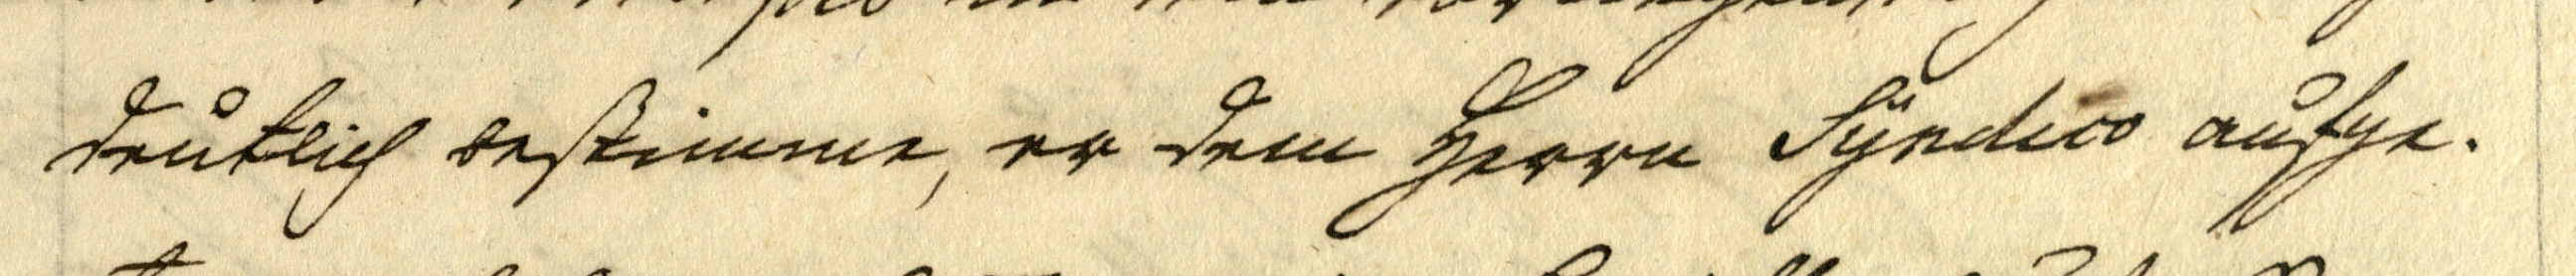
deutlich bestimme, er dem Herrn Sÿndico aufge¬
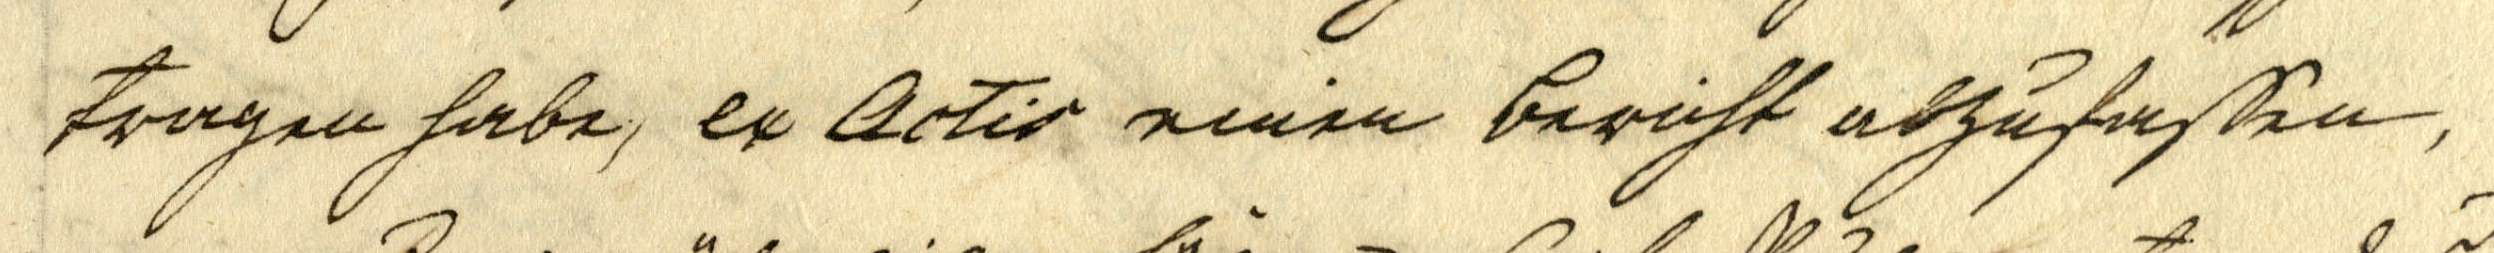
tragen habe, ex Actis einen Bericht abzufassen,
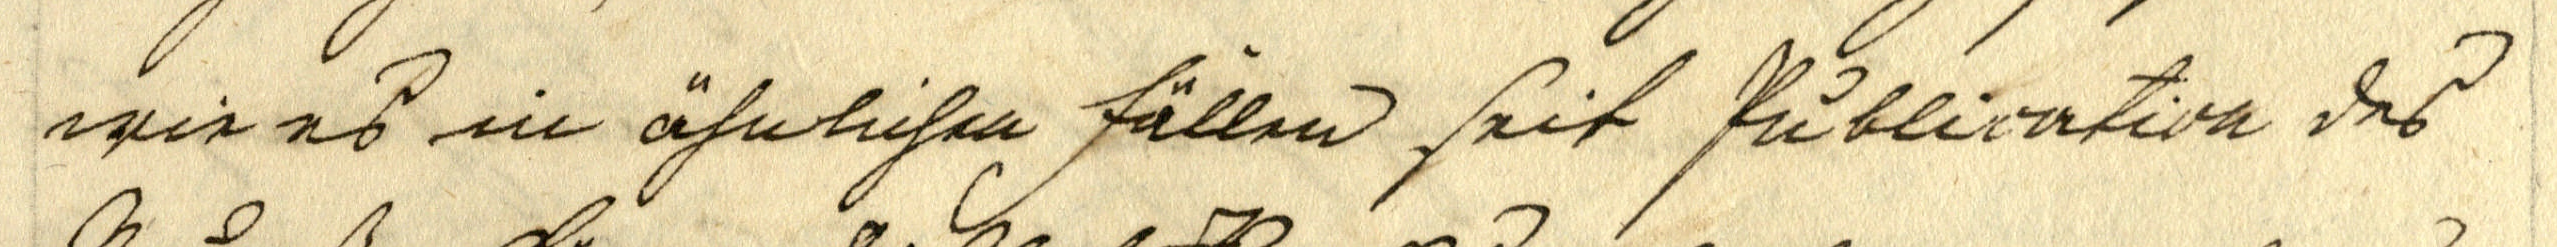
wie es in ähnlichen Fällen seit Publication des
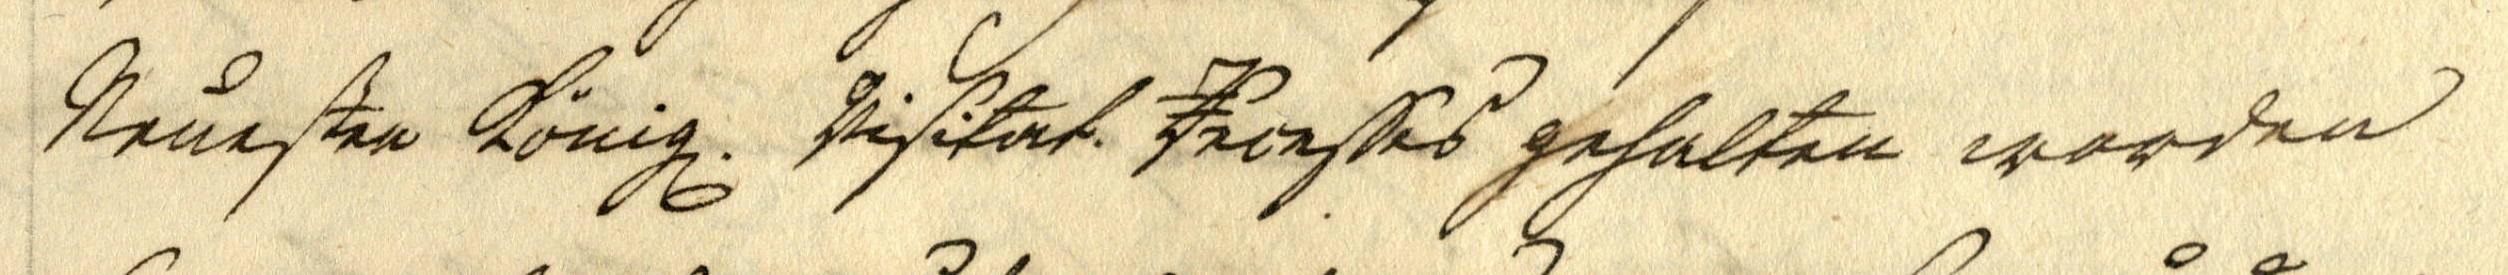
Neuesten Königl. Visitat. Recesses gehalten worden
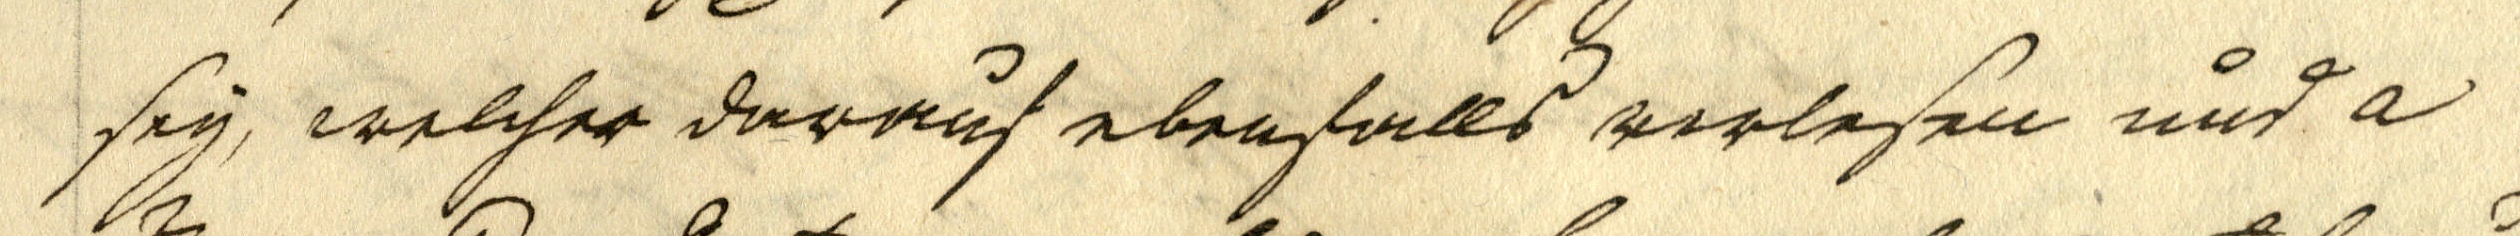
seÿ, welcher darauf ebenfalls verlesen und a
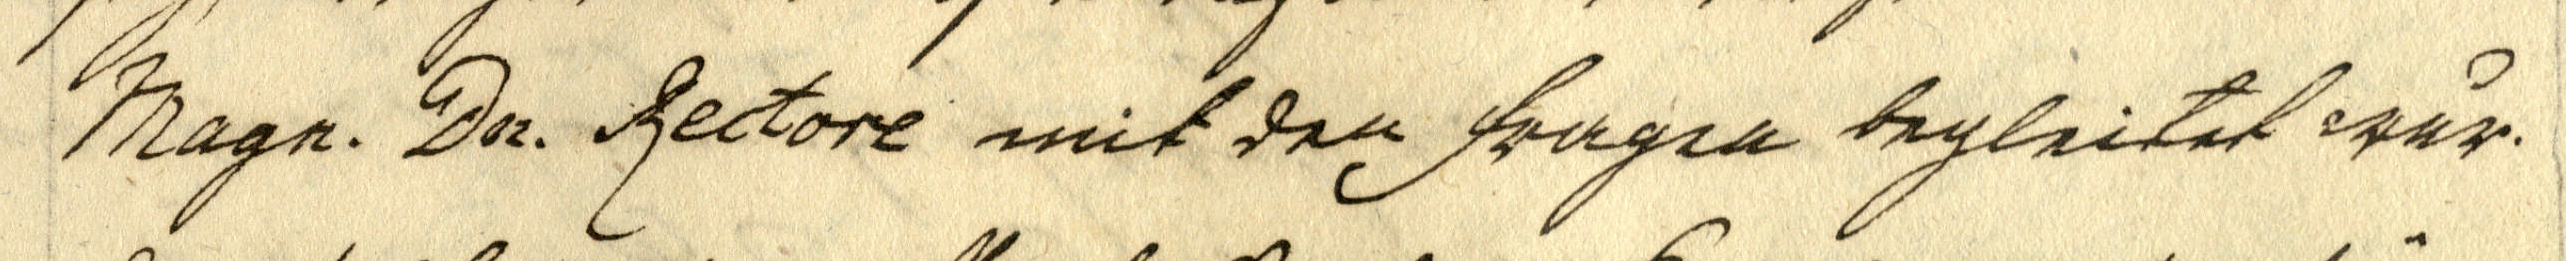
Magn. Dn. Rectore mit den Fragen begleitet wur¬
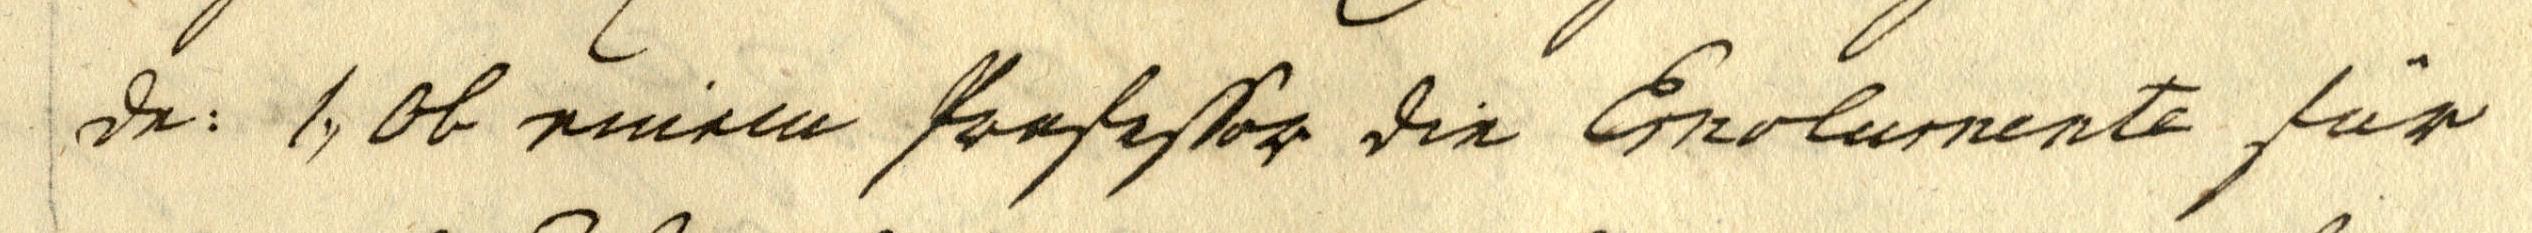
de: 1., ob einem Professor die Emolumente für
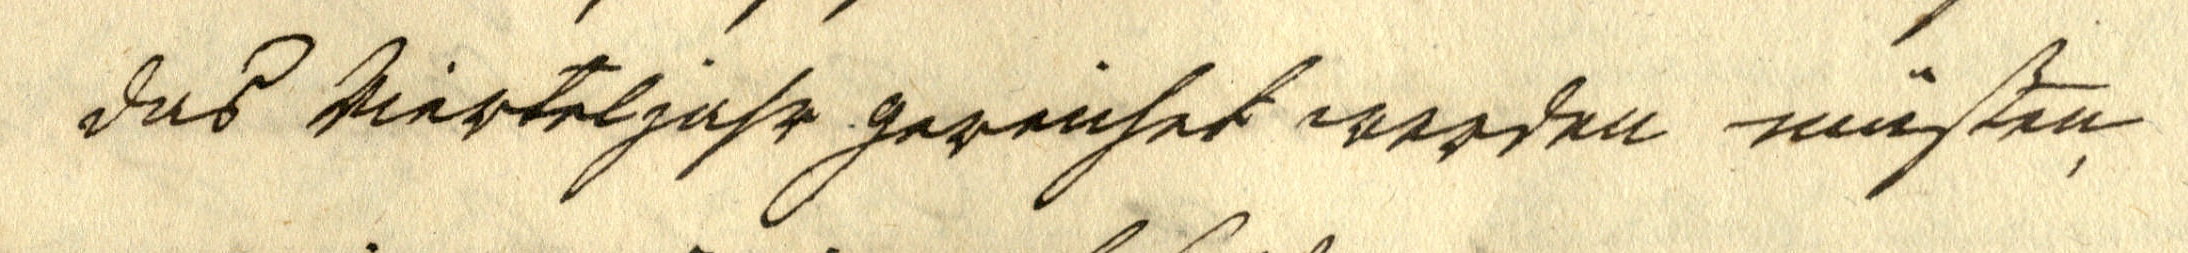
das Vierteljahr gereichet werden müßten,
